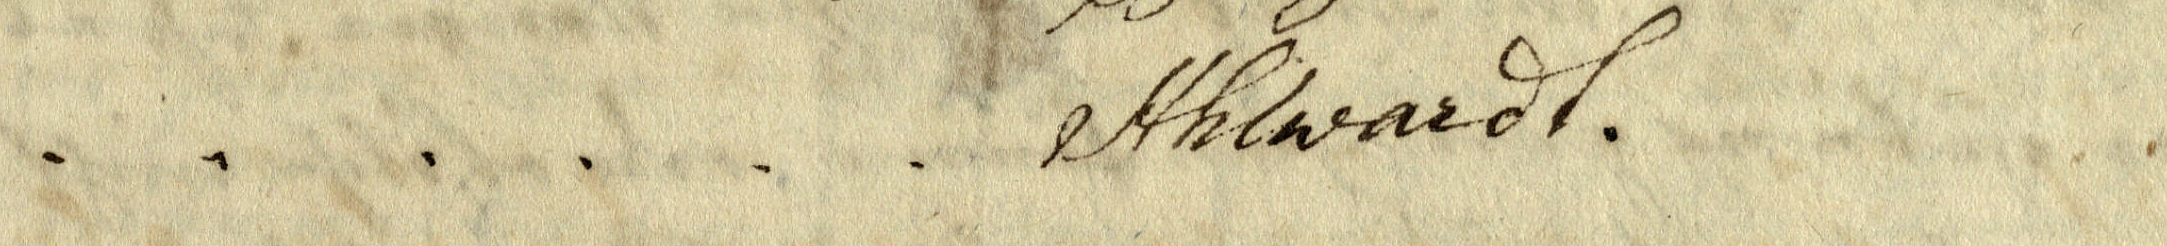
Maÿer
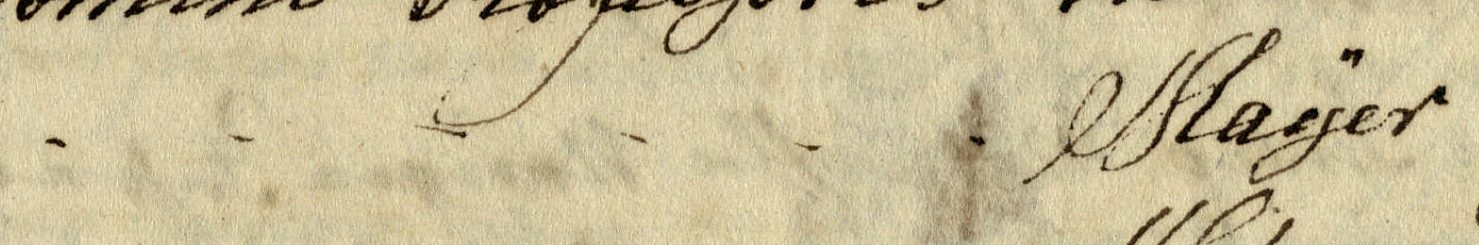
Ahlwardt.
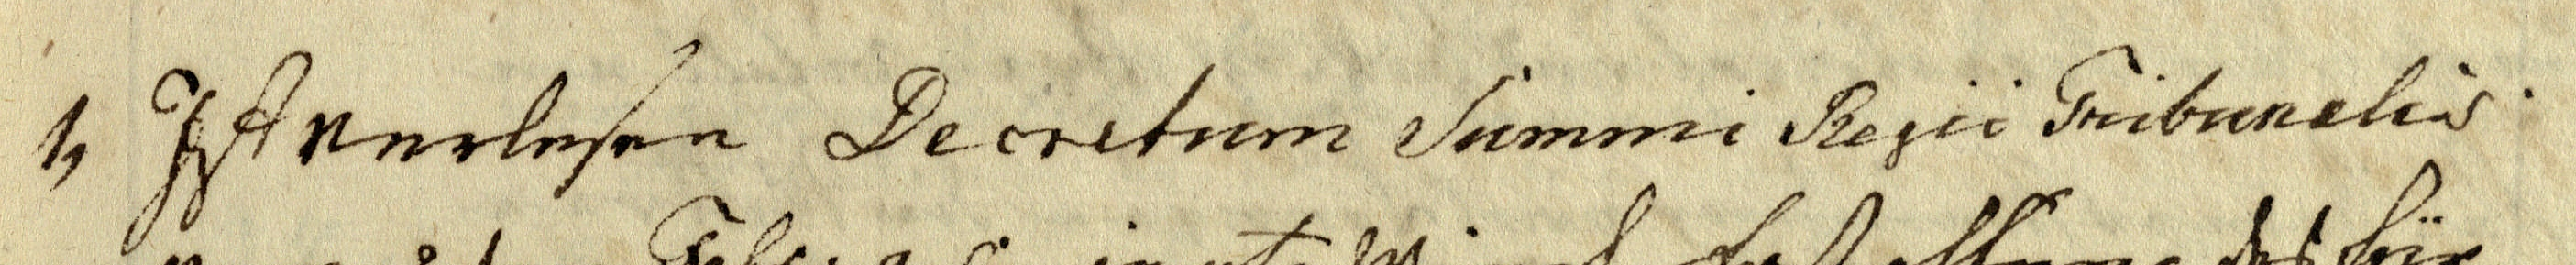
1, Ist verlesen Decretum Summi Regii Tribunalis
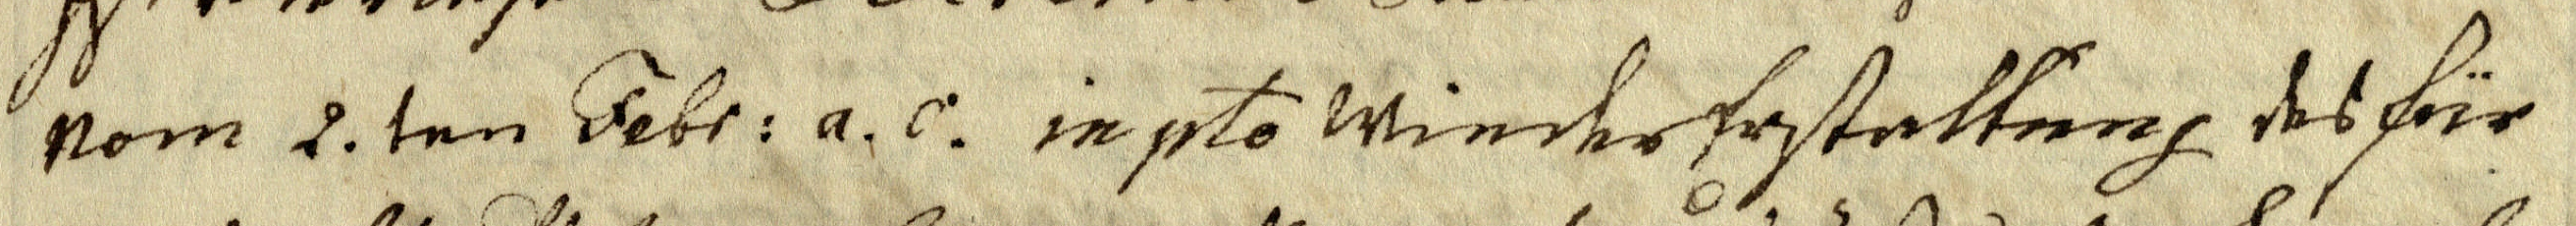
vom 2. ten Febr. a. c. in pto Wiedererstattung des für
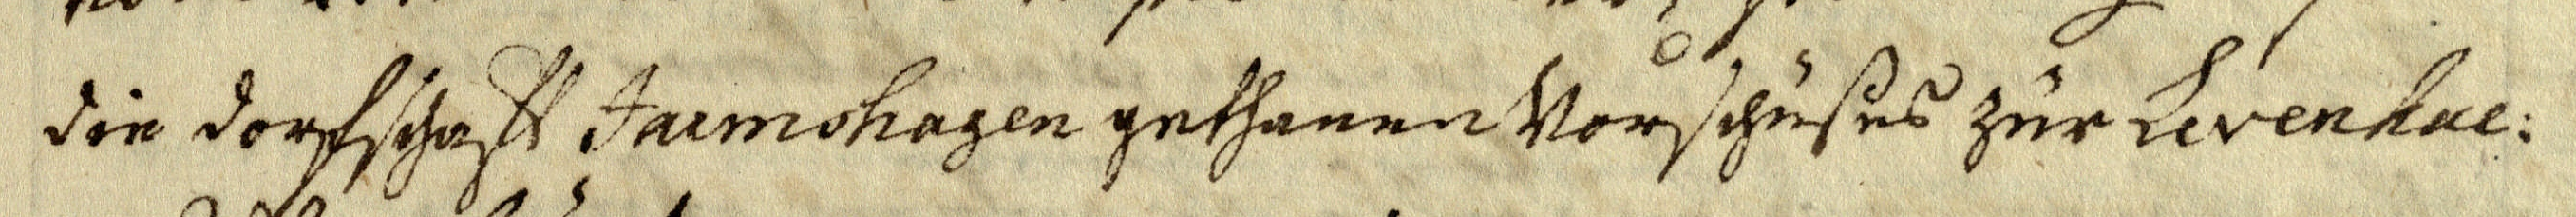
die Dorfschaft Jarmshagen gethanen Vorschußes zur Levenhae¬
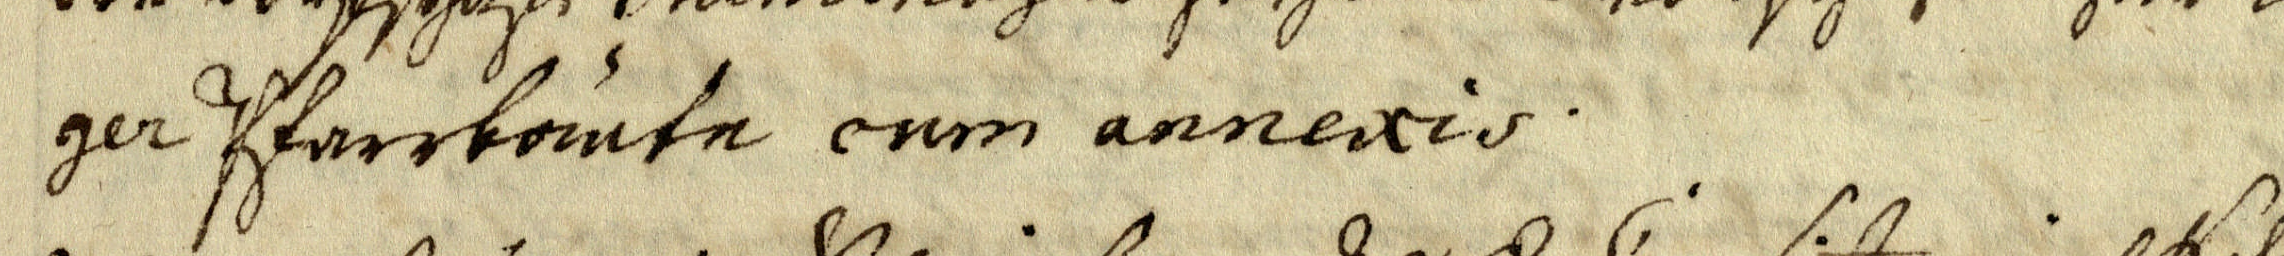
ger Pfarrbaute cum annexis.
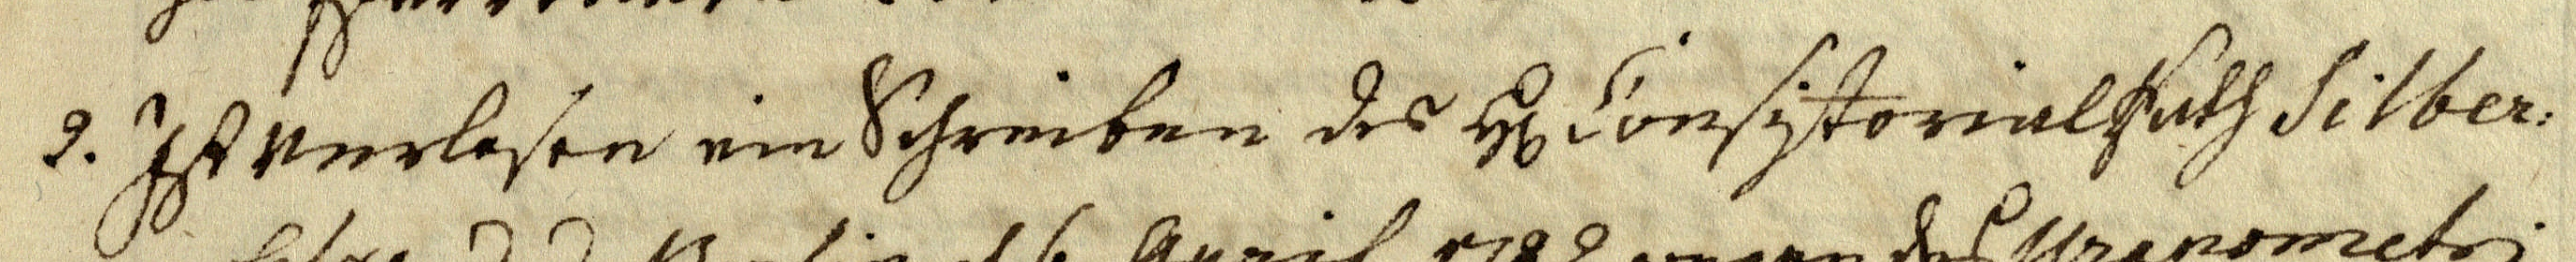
2. Ist verlesen ein Schreiben des H ConsistorialRath Silber¬
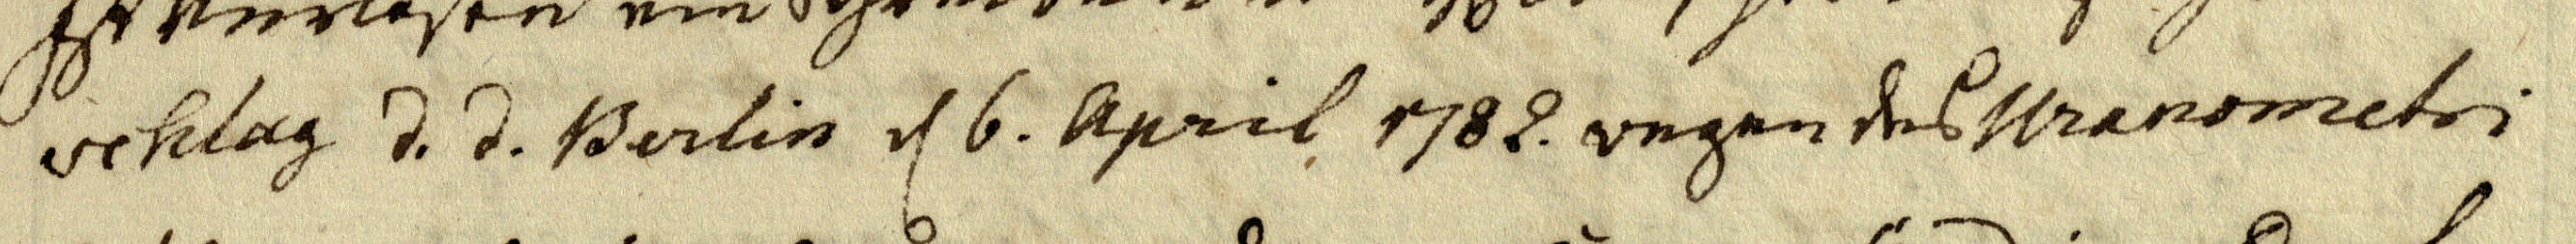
schlag d. d. Berlin d. 6 April 1782. wegen des Uranometri
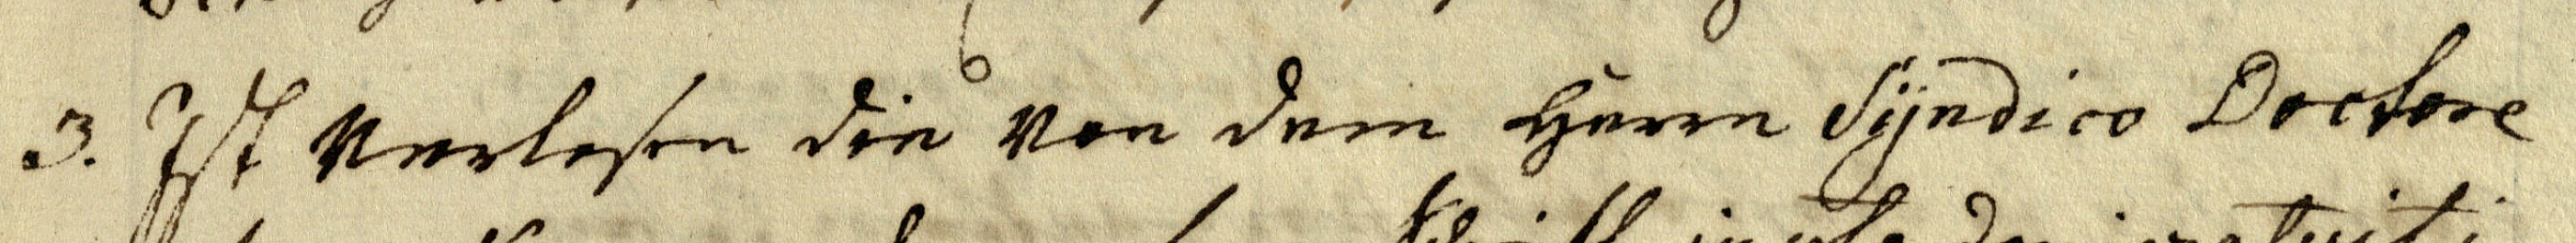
3 Ist verlesen die von dem Herrn Sÿndico Doctore
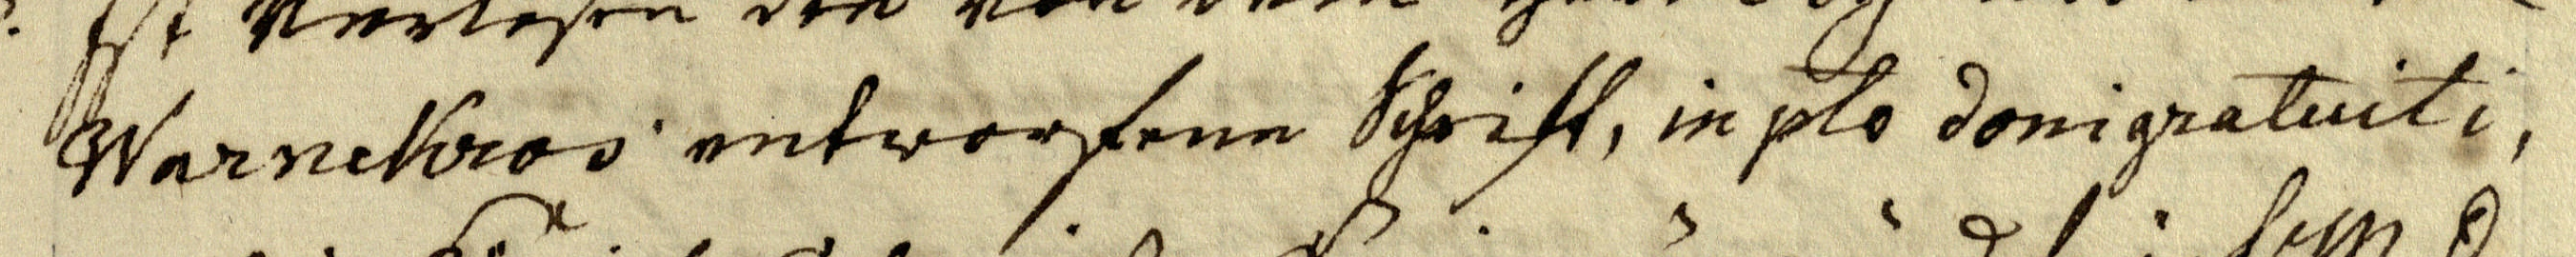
Warnekros entworfene Schrift, in pto donigratuiti,
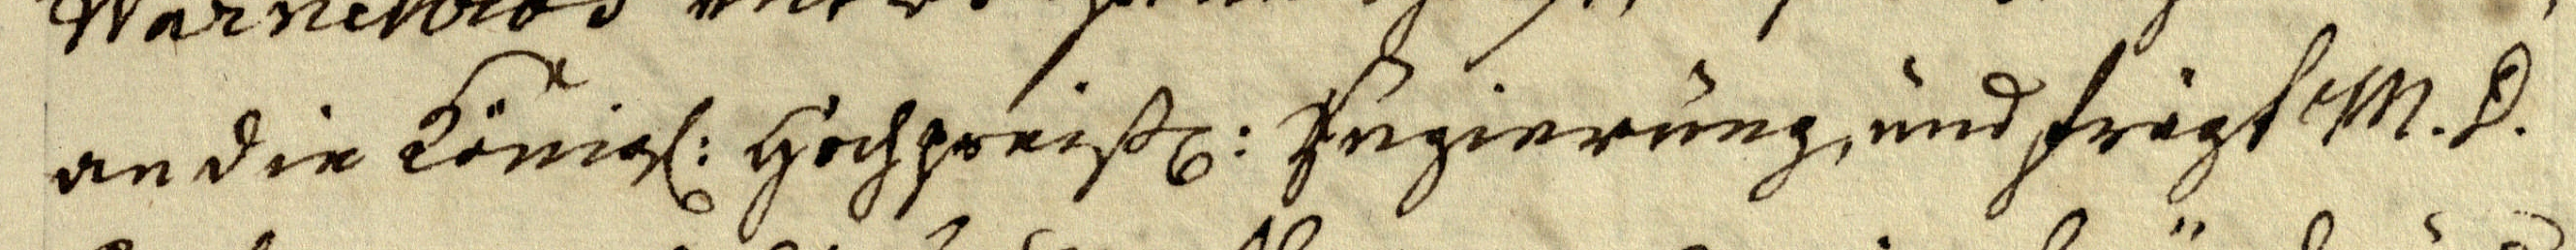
an die Königl. Hochpreißl. Regierung, und frägt M. D.
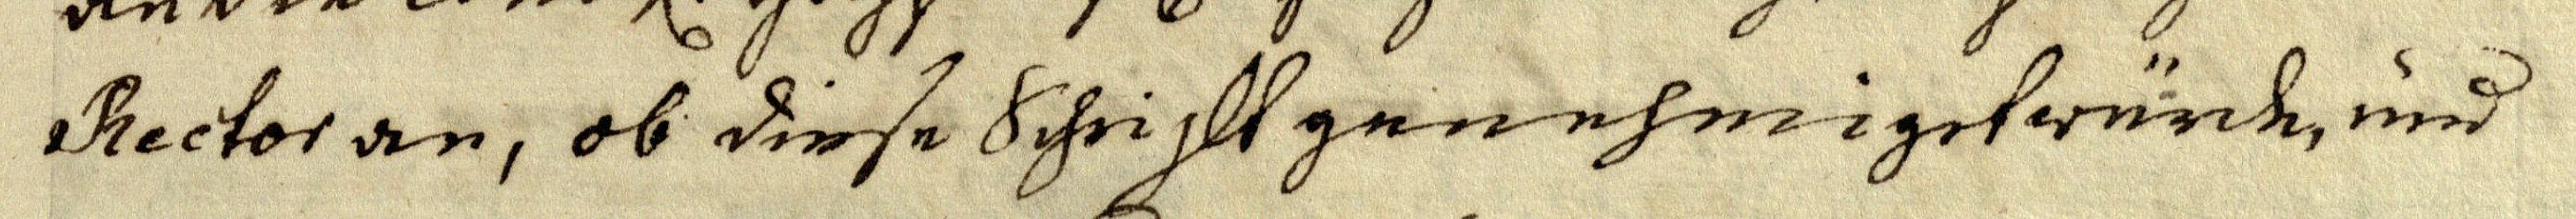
Rector an, ob diese Schrift genehmiget würde, und
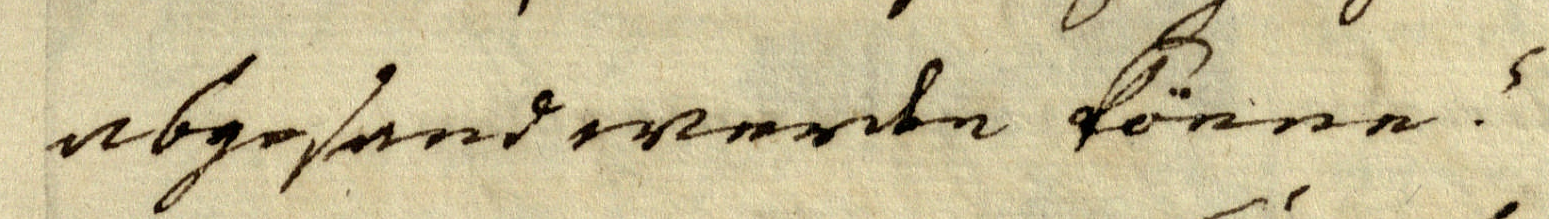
abgesand werden könne?
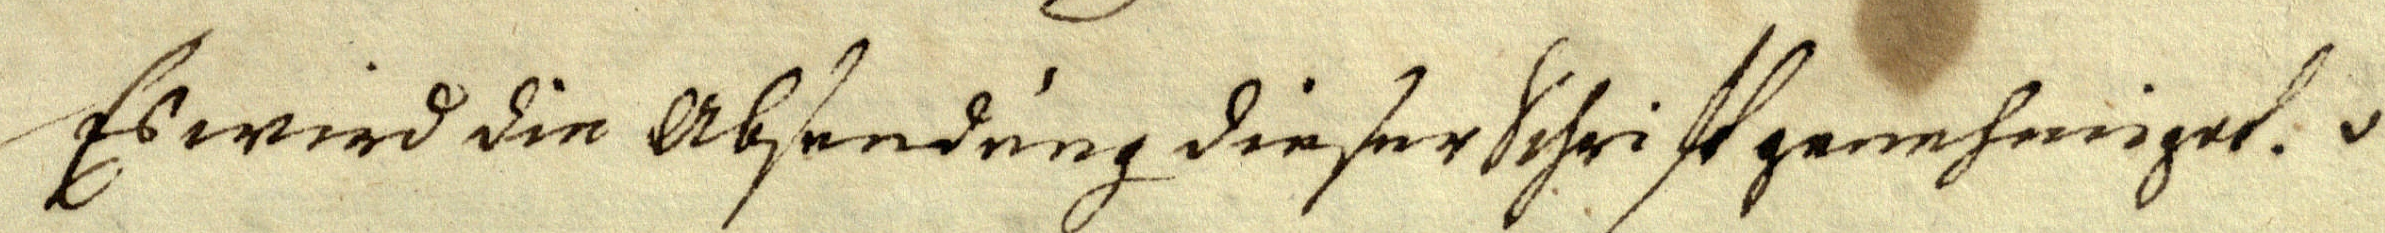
Es wird die Absendung dieser Schrift genehmiget.
